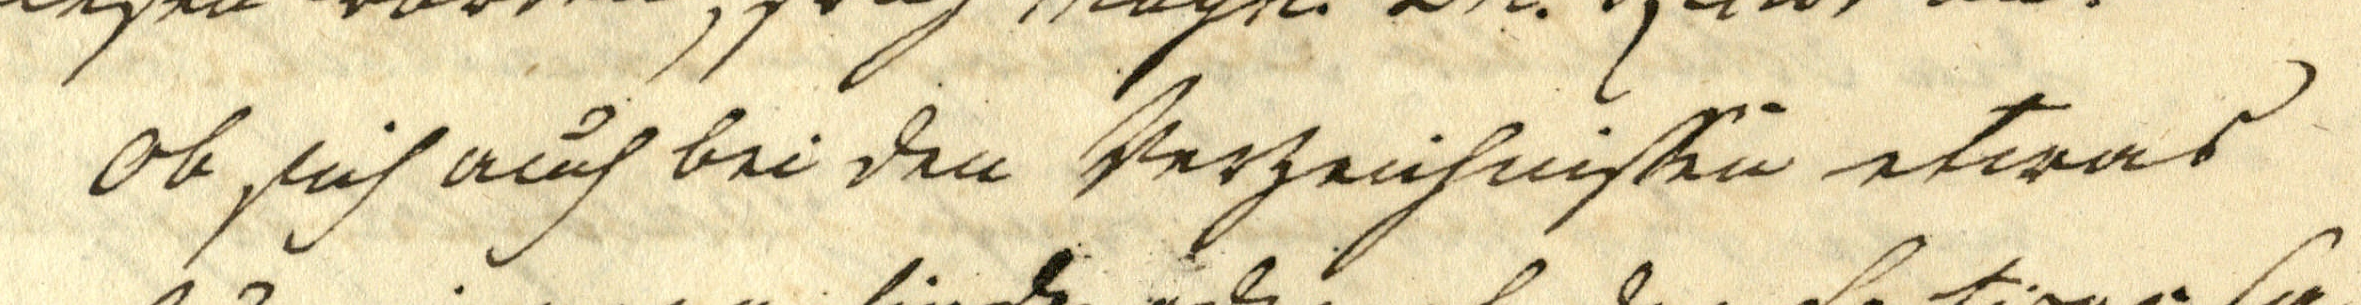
Ob sich auch bei den Verzeichnissen etwas
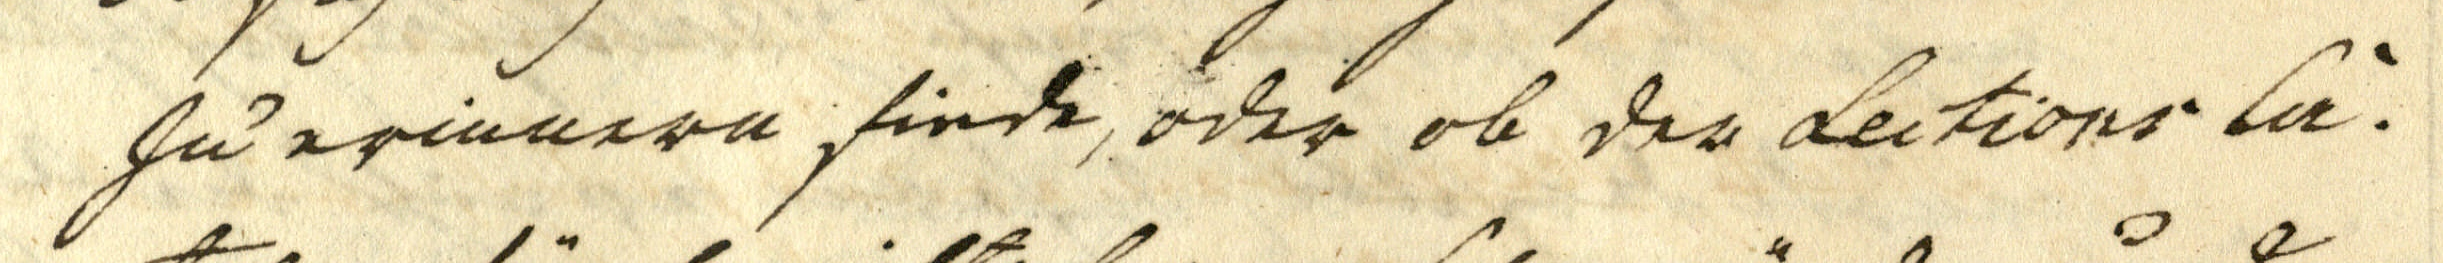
zu erinnern finde, oder ob der Lections Ca¬
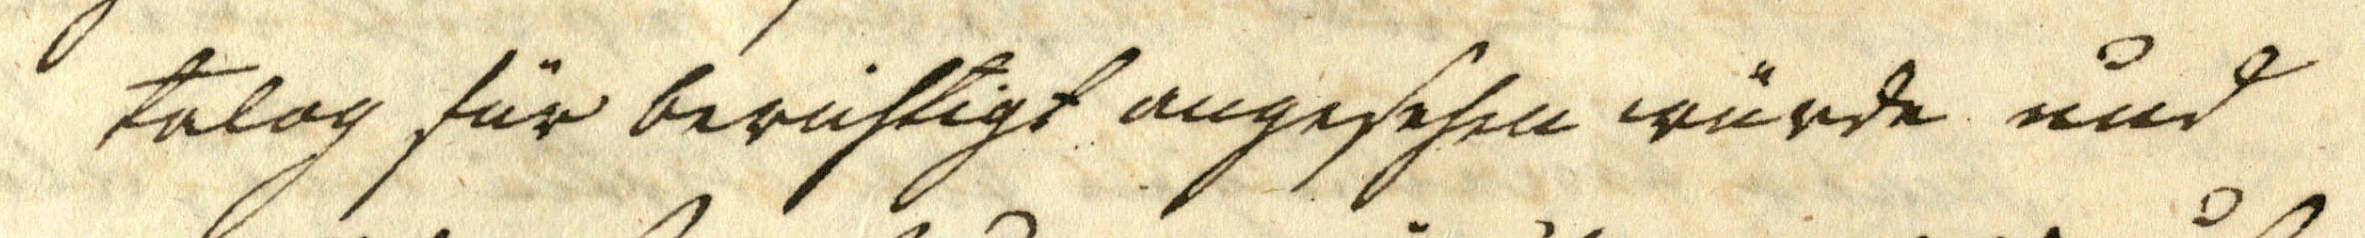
talog für berichtigt angesehen würde und
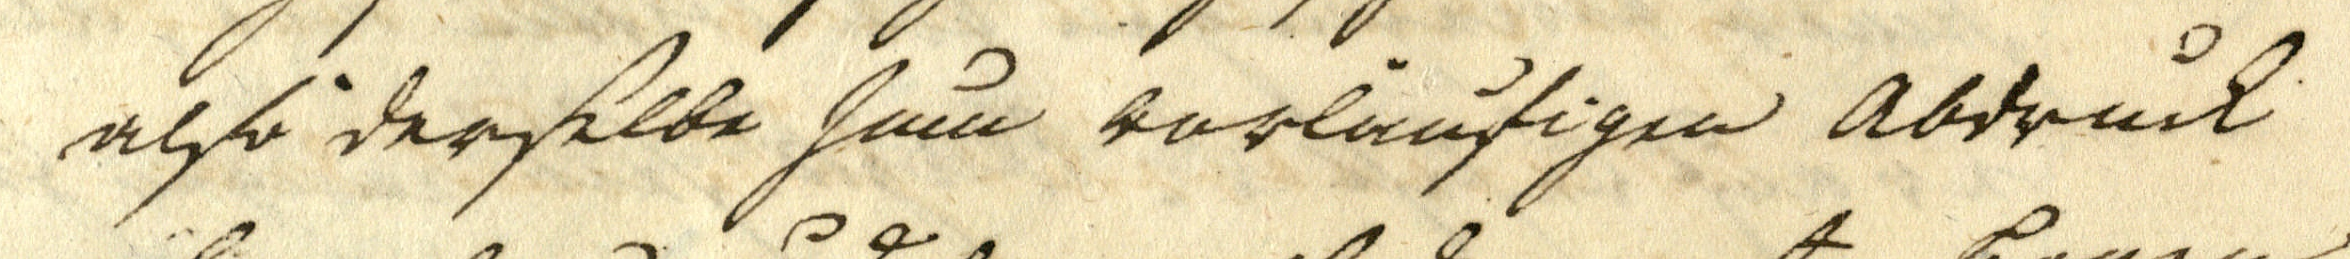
also derselbe zum vorläufigen Abdruck
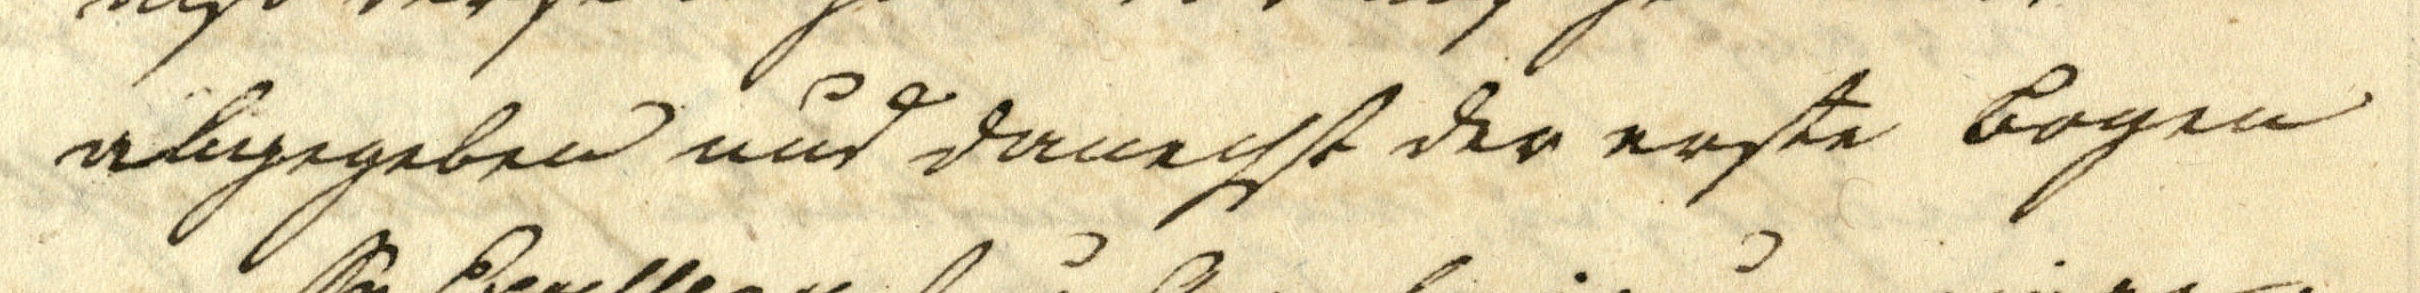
abgegeben und danechst der erste Bogen
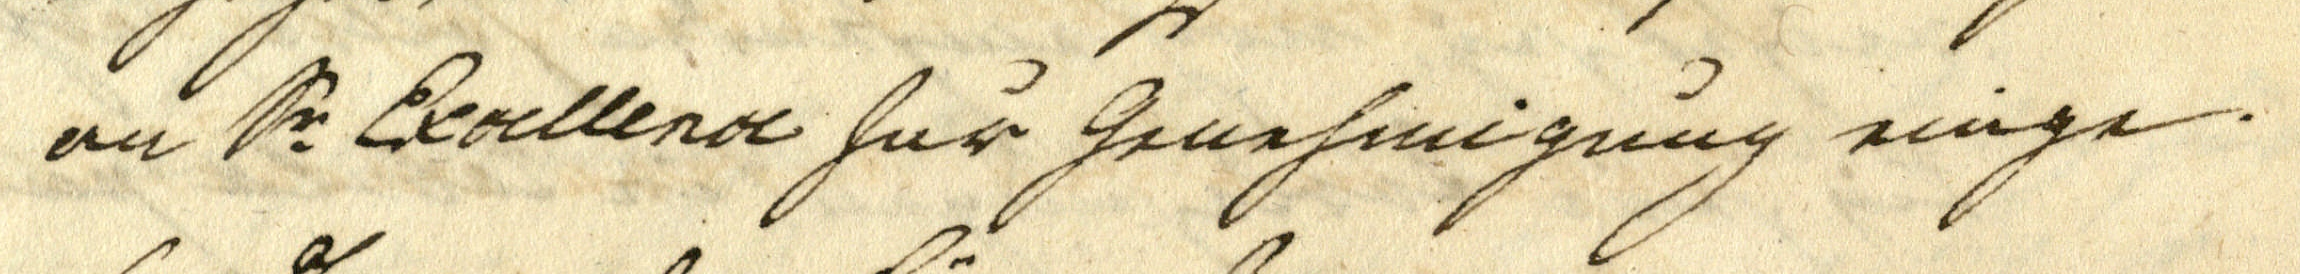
an Sr Excellence zur Genehmigung einge¬
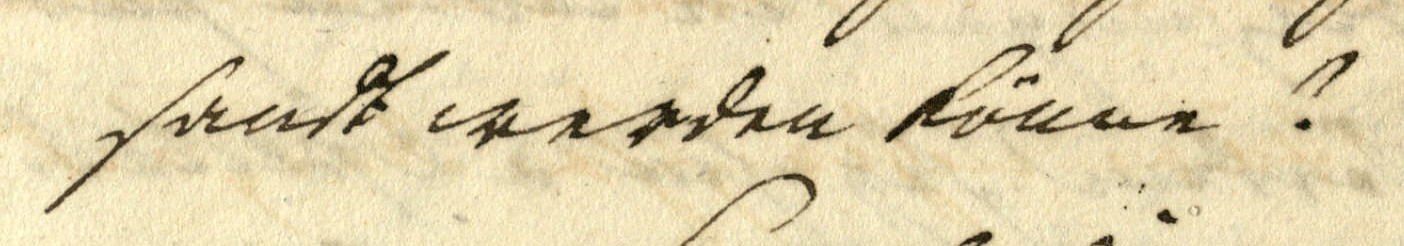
sandt werden könne?
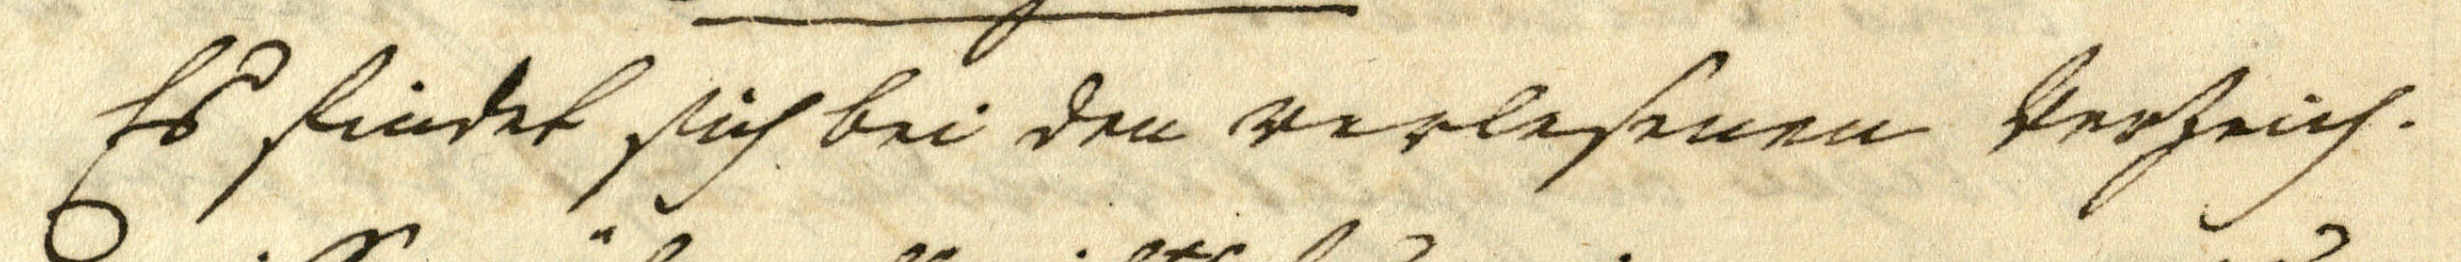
Es findet sich bei den verlesenen Verzeich¬
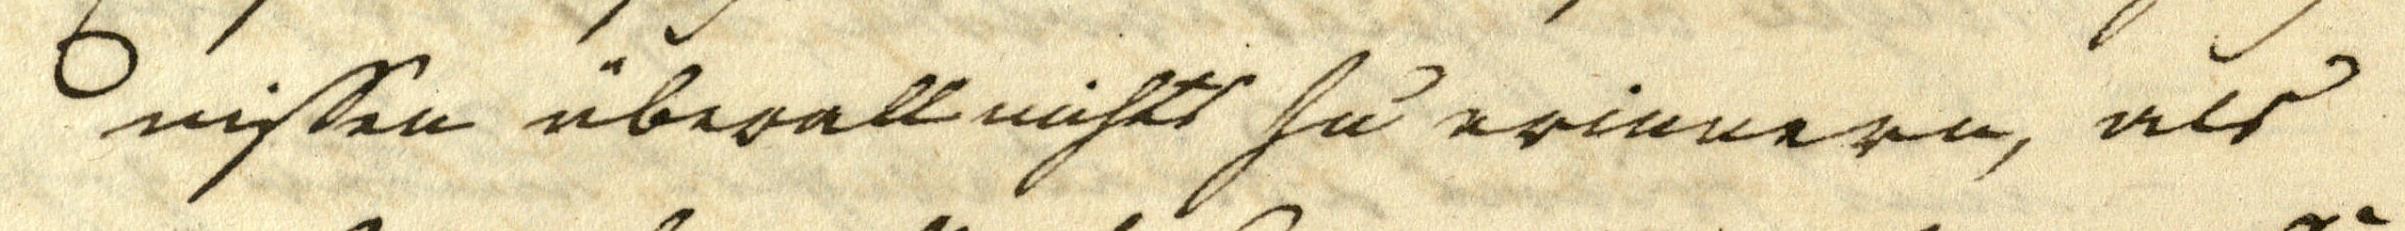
nissen überall nichts zu erinnern, als
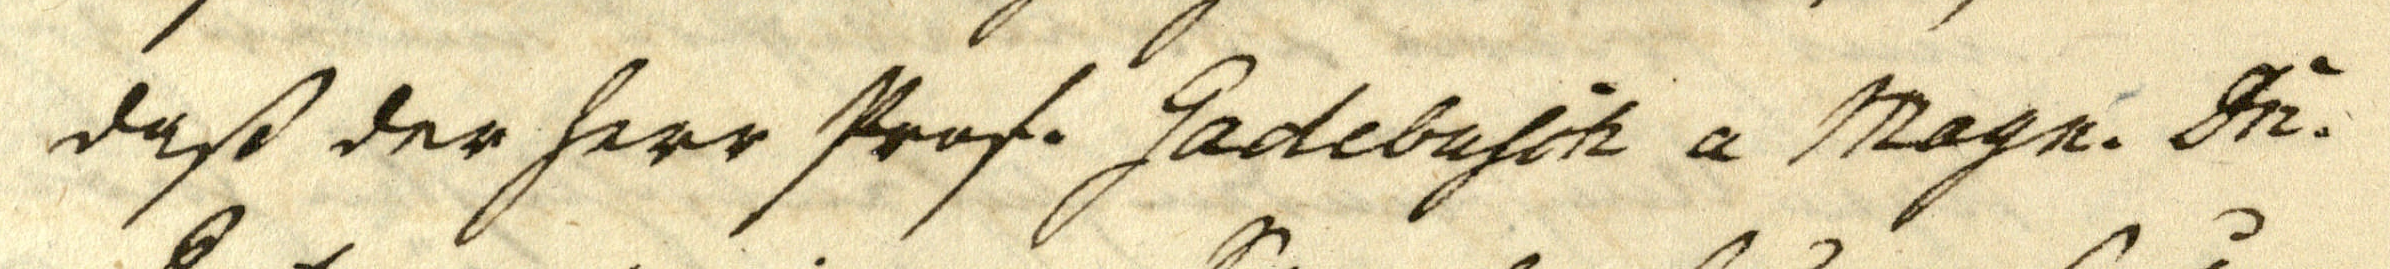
daß der Herr Prof. Gadebusch a Magn. Dn.
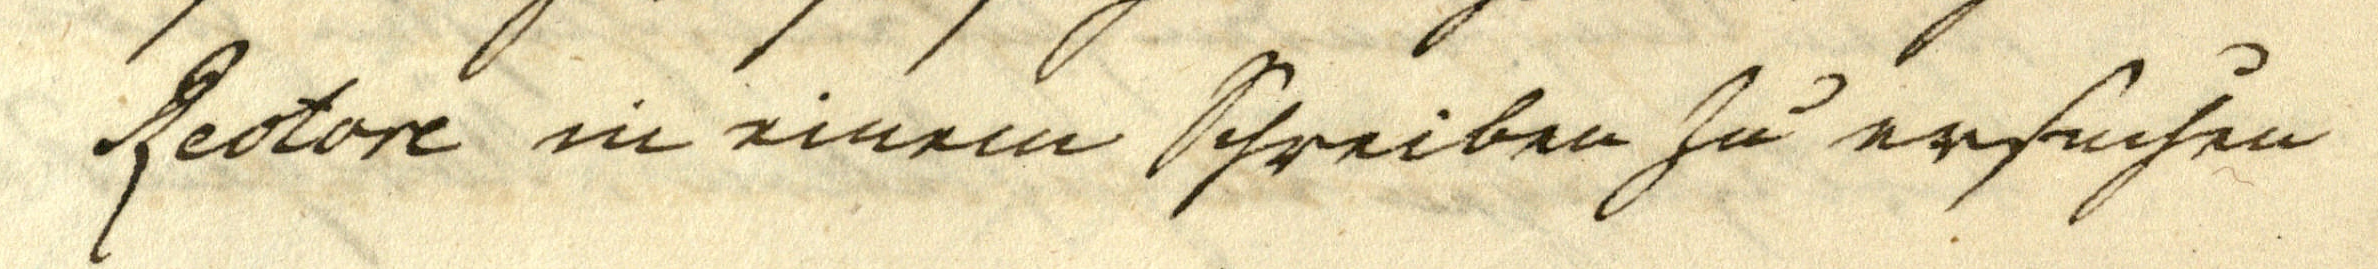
Rectore in einem Schreiben zu ersuchen
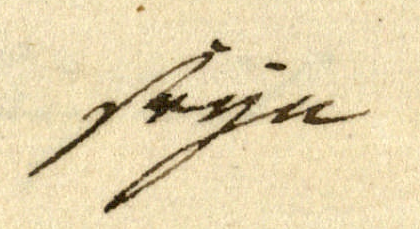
seÿn
